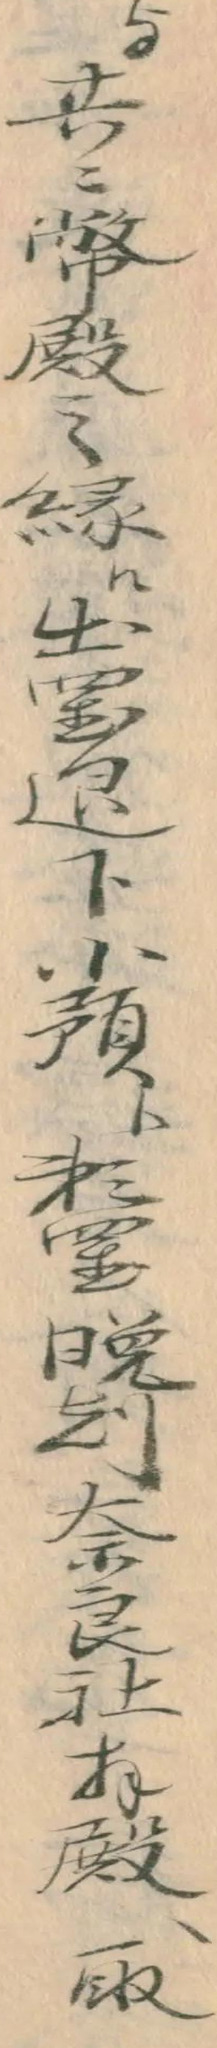与共ニ幣殿之縁え出置退下小預え頼置晩刻奈良社拝殿へ取
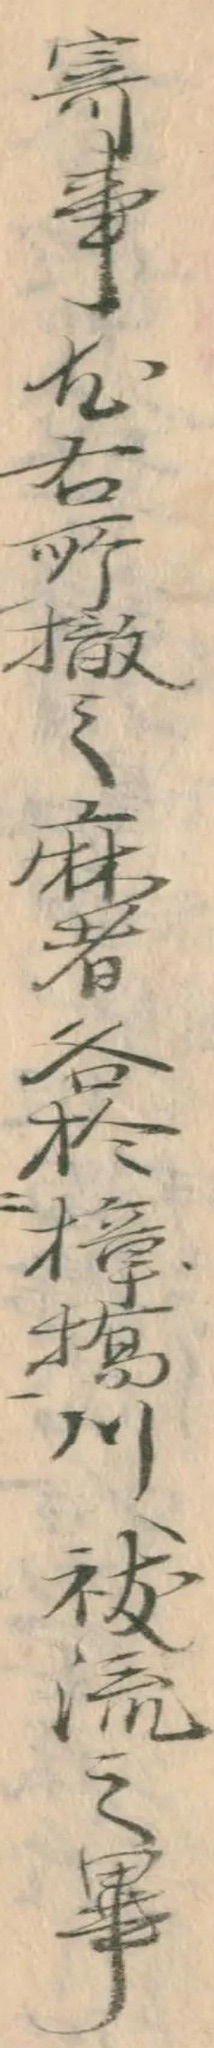寄事尤右所撒之麻者各於樟橋川へ祓流之畢
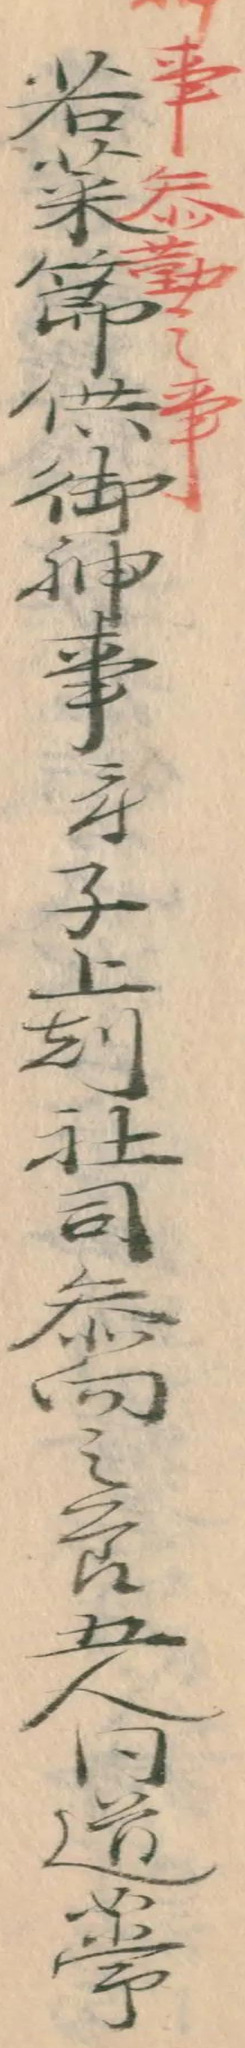一若菜節供御神事ニ付子上刻社司参向之節五人同道如常
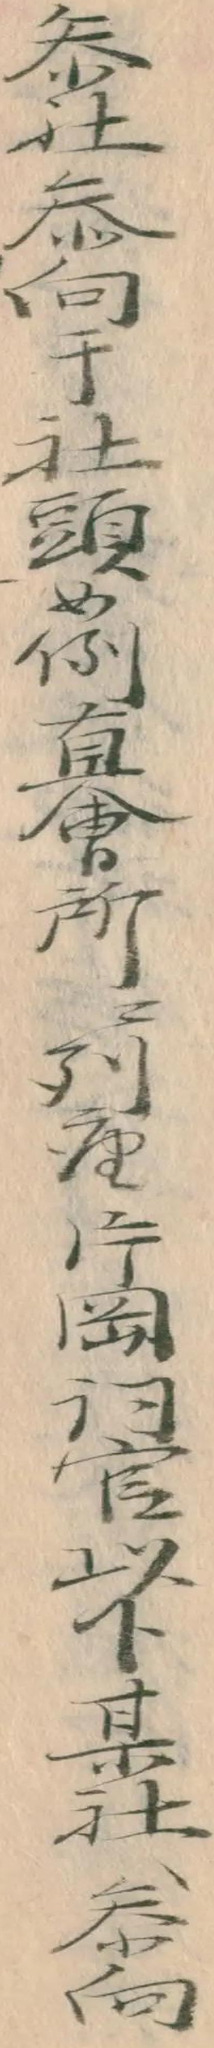参社参向于社頭如例直會所ニ列座片岡祠官以下某社へ参向
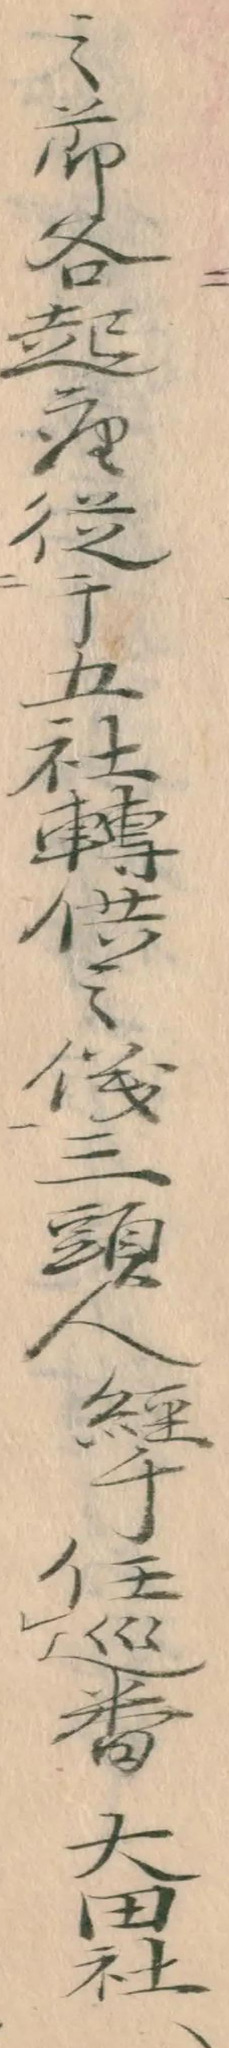之節各起座従于五社轉供之儀三頭人経千任巡番大田社へ
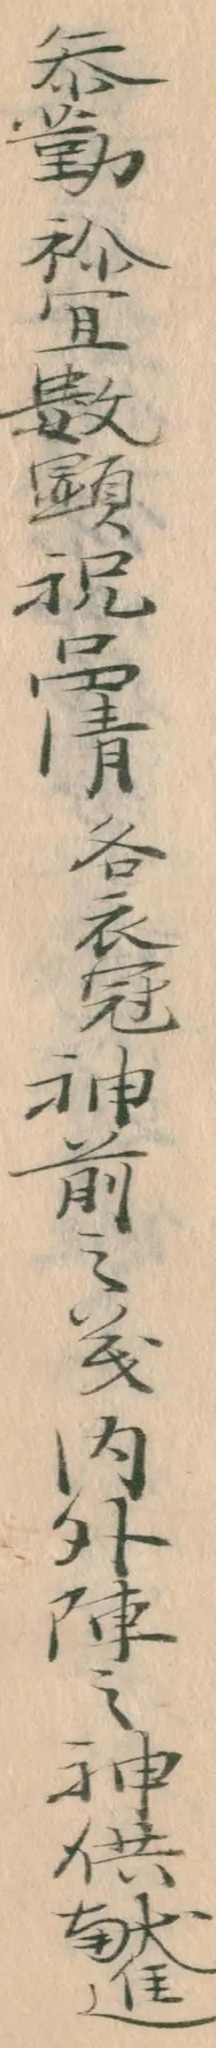参勤祢宜数顕祝品清各衣冠神前之義内外陣之神供献進
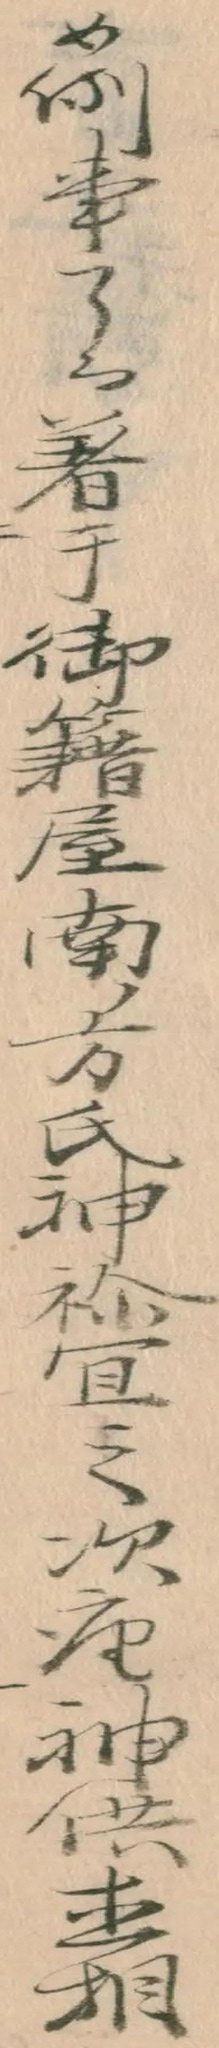如例事了而着于御籍屋南ノ方氏神祢宜之次座神供直相
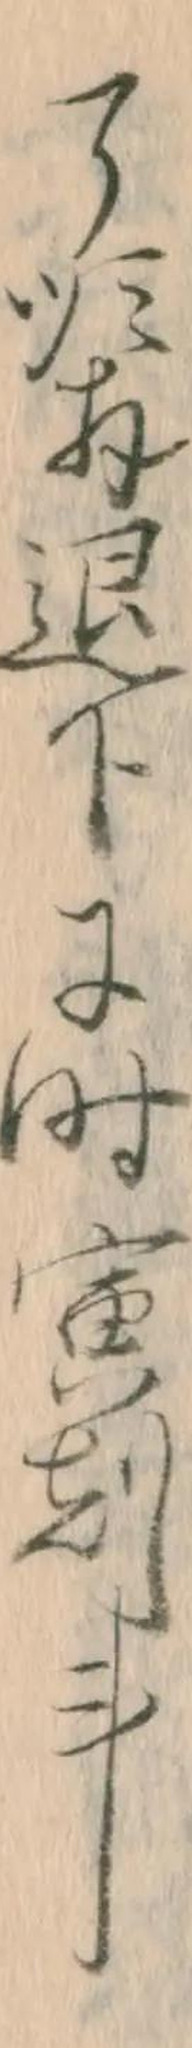了順拝退下于時寅刻斗
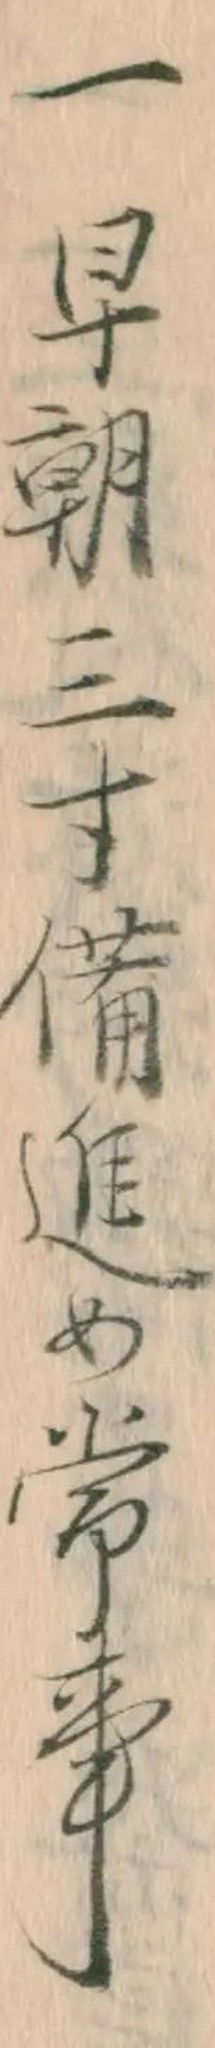一早朝三寸備進如常事
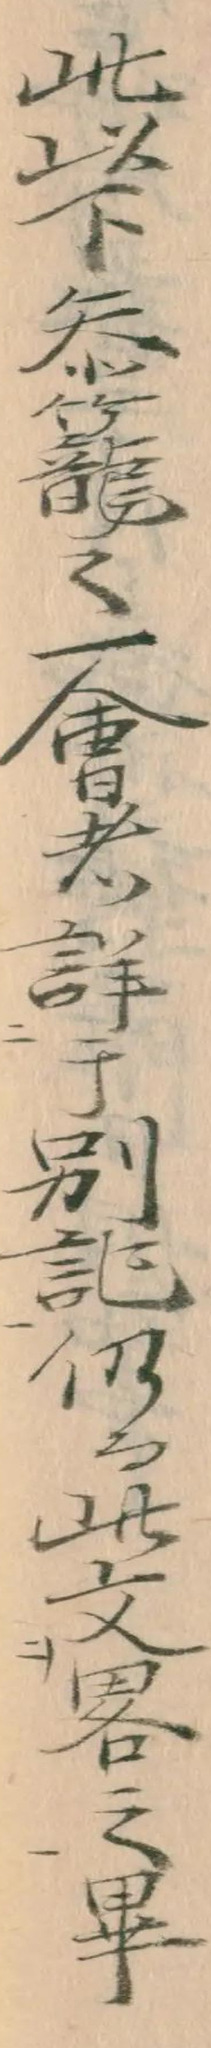此以下参籠之一會者詳于別記仍而此文畧之畢
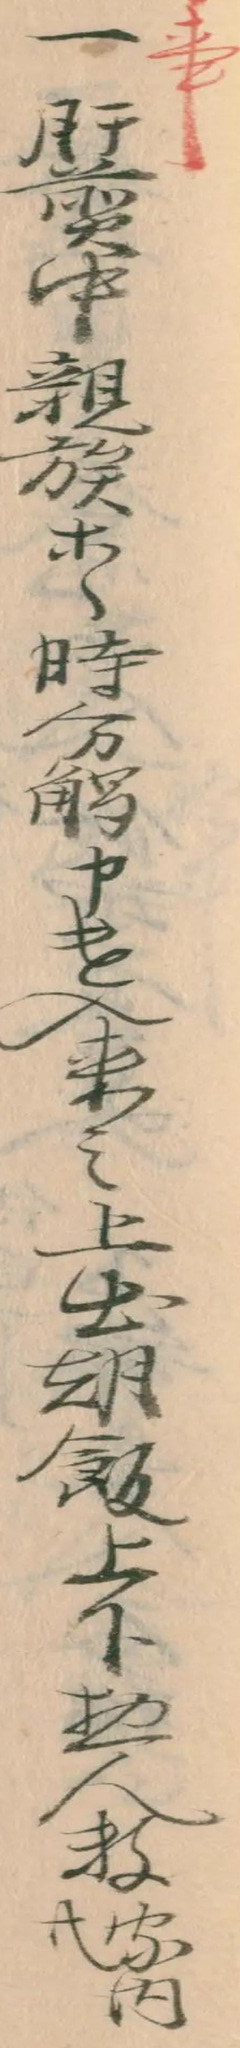一肝煎中親族等之時分觸申遣入来之上出朝飯上下惣人数家内共
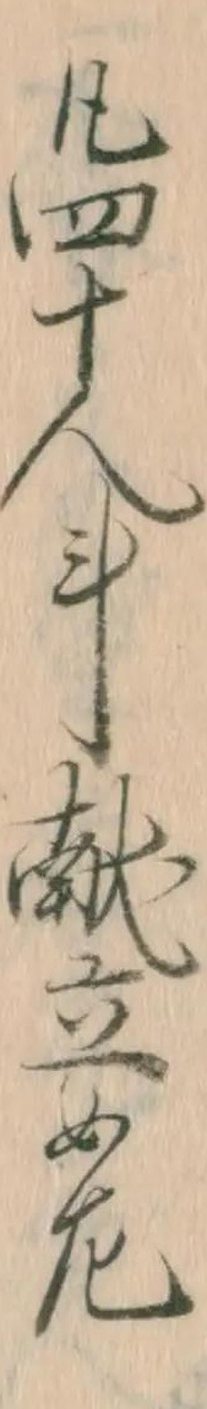凡四十人斗献立如左
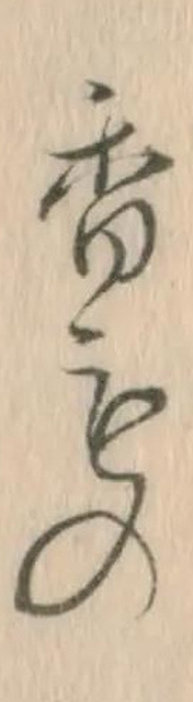香もの
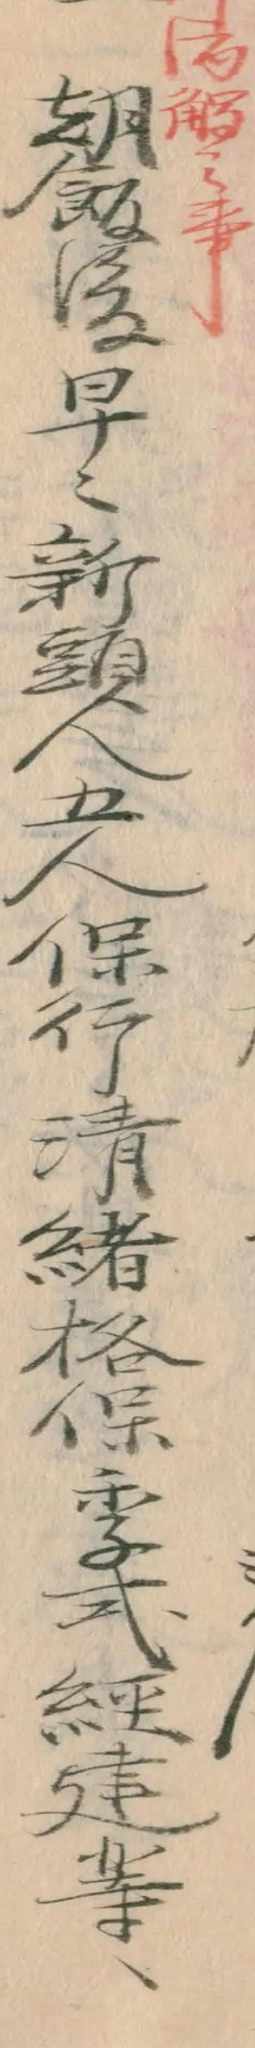一朝飯後早々新頭人五人保行清緒格保季式経建等へ
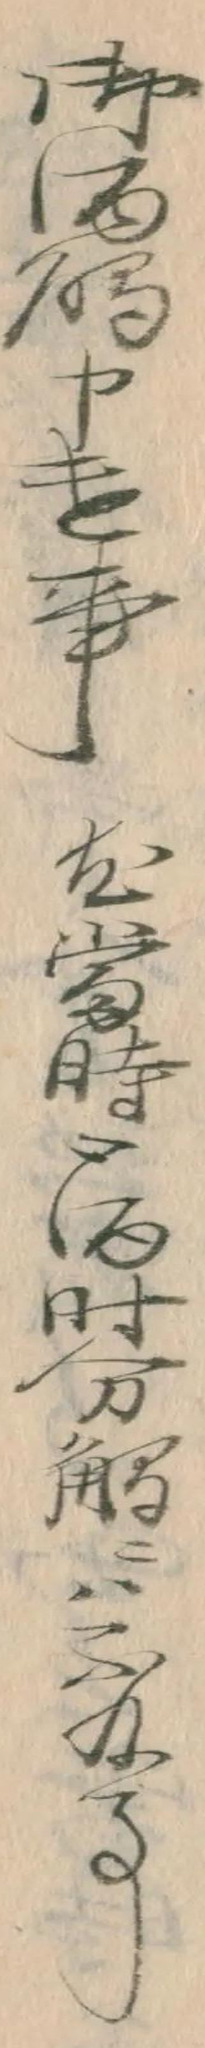御酒觸申遣事尤當時御酒時分觸ニハ不及事
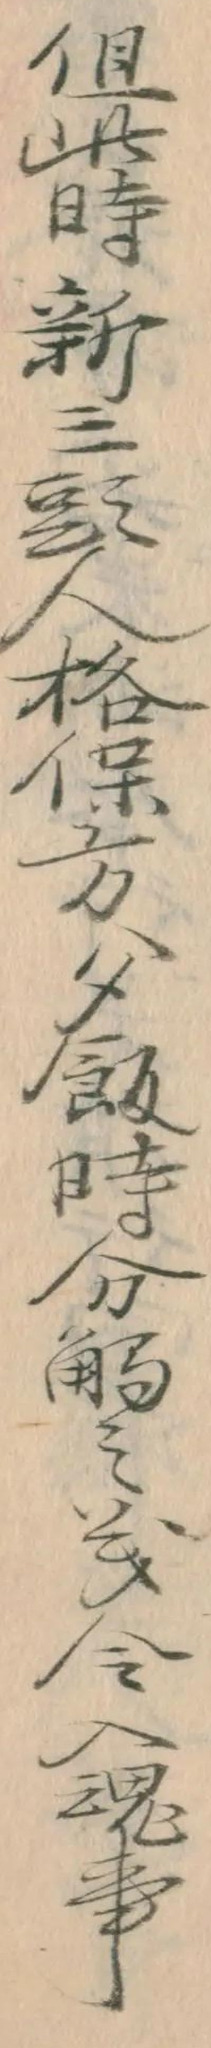但此時新三頭人格保方へ夕飯時分觸之義令入魂事
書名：賀茂社記録. 第74冊
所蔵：国立国会図書館 National Diet Library, JAPAN
